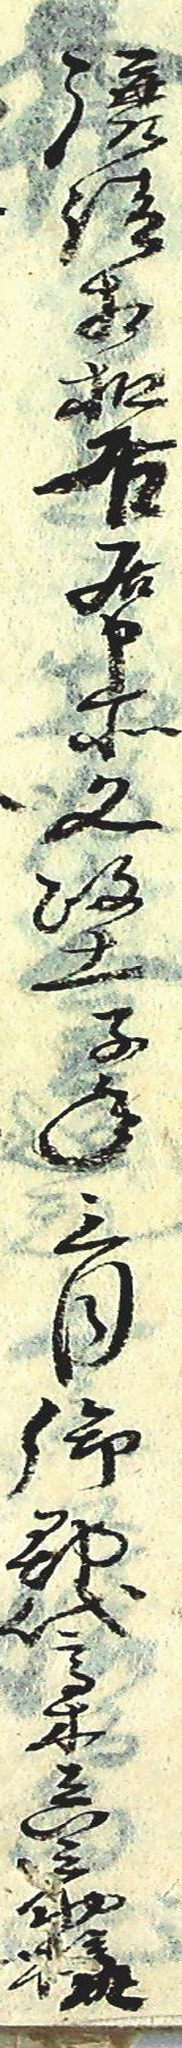譲請相扣居居申所文政十一子年三月御郡代高木真之助様
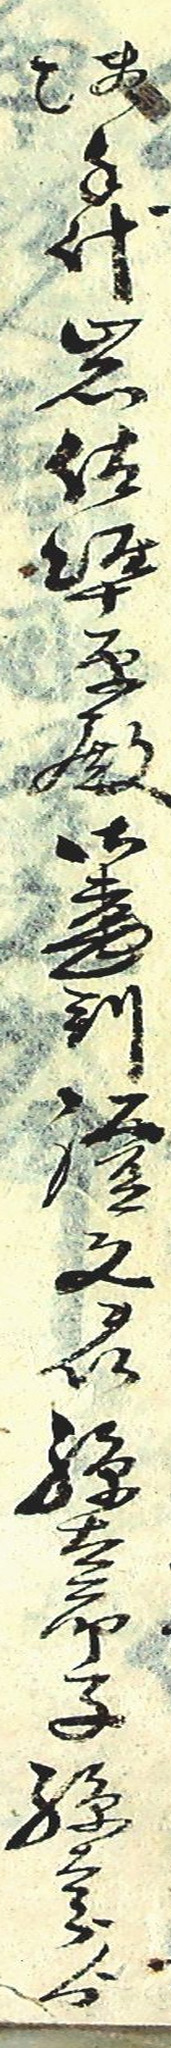御手代岩佐準平殿御裏判証文を以孫太郎子孫太郎ゟ
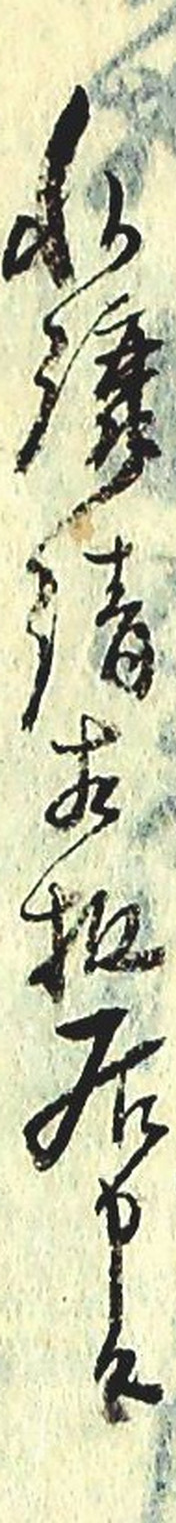私譲請相扣居申候
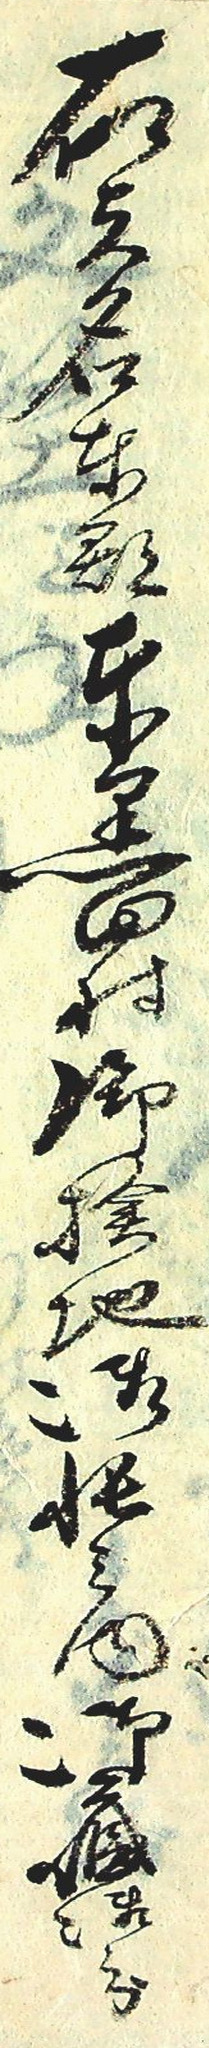右は名東郡東黒田村御検地御帳之内御蔵御分
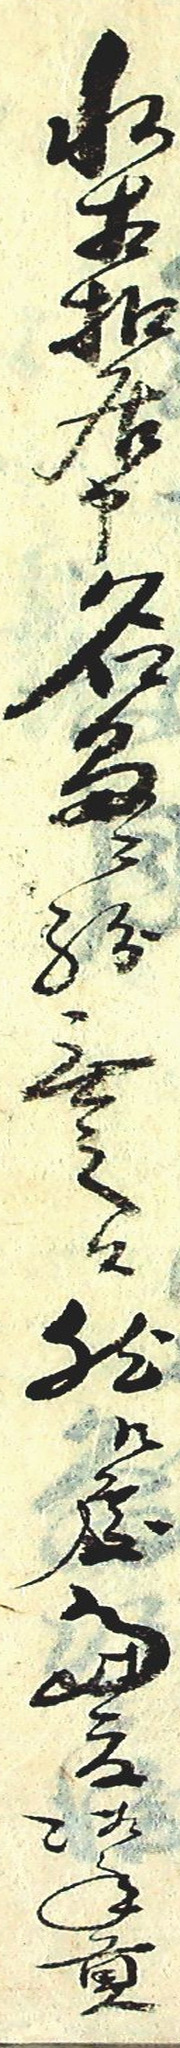私相扣居申名畠に紛無之候然る処当夏御年貢
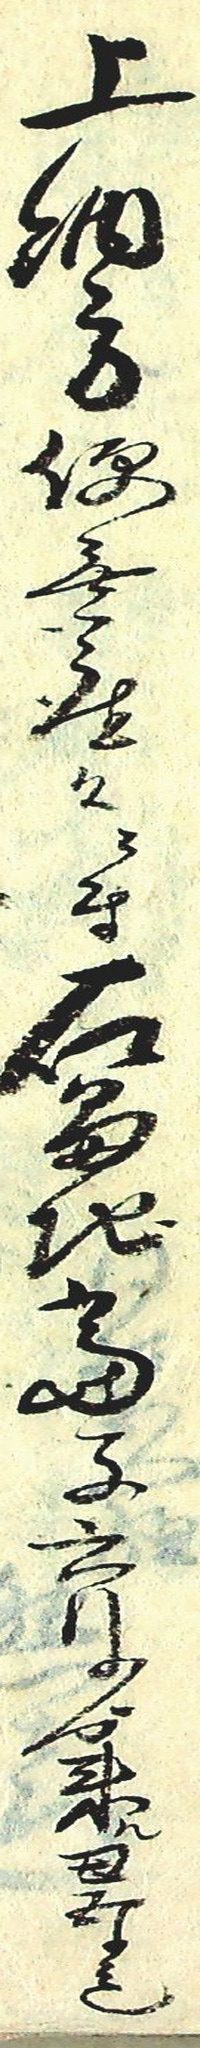上納方便無御座候に付右畠地当子六月ゟ来る丑五月迄
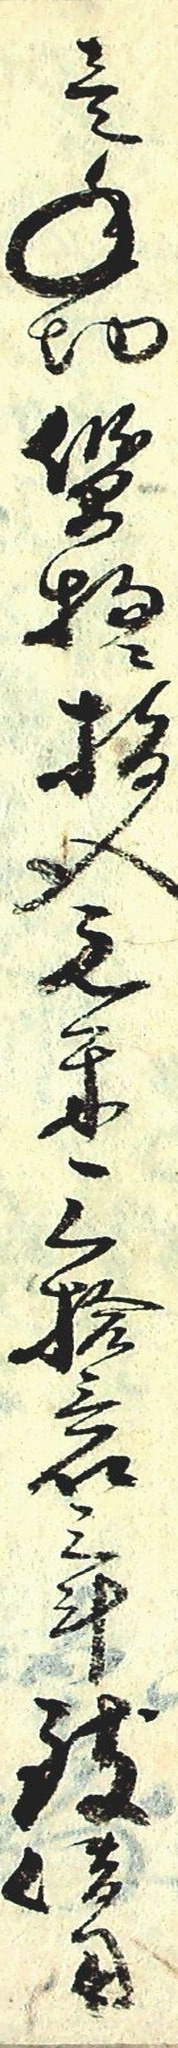壱年切質物に指入元米三拾三石三斗致借用
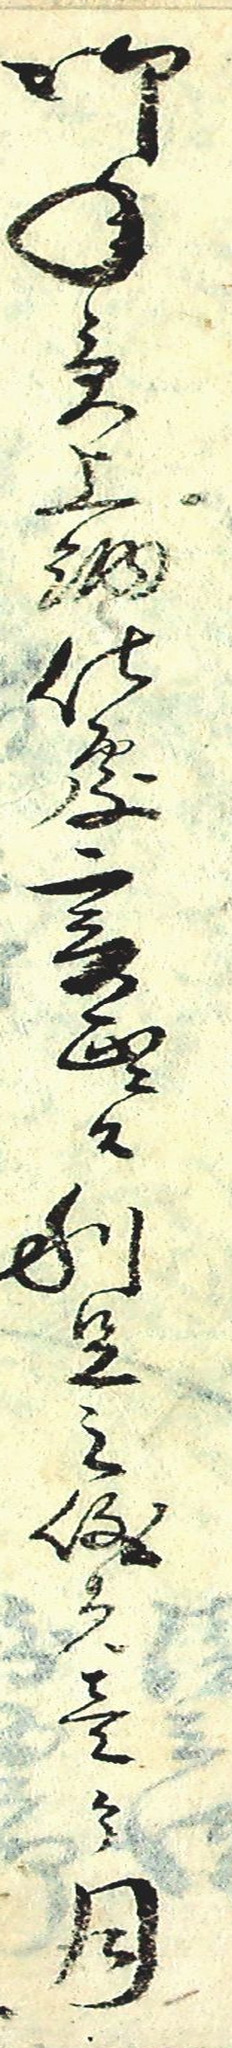御年貢上納仕処実正に候利足之儀は壱ヶ月
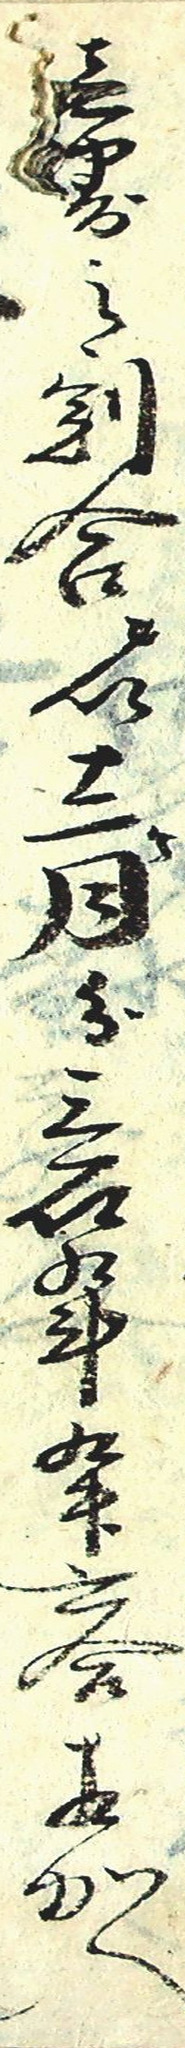壱歩之割合を以十二ヶ月分三石九斗九升六合相加へ
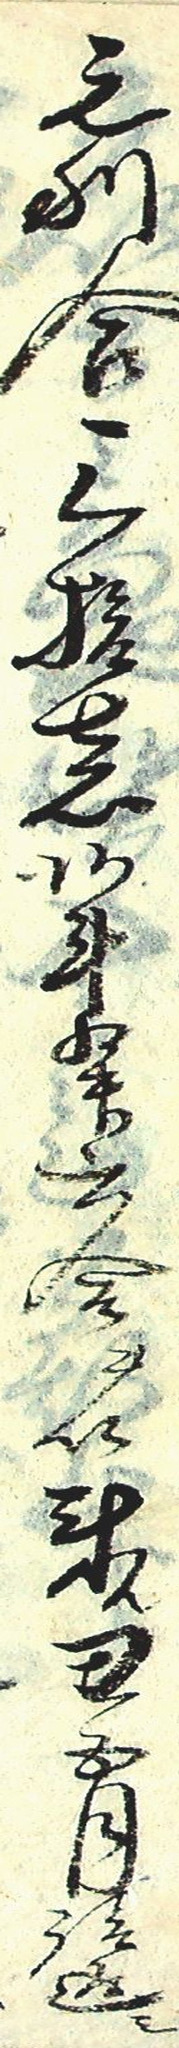元利合三拾七石弐斗九升六合を以来る丑五月請返し
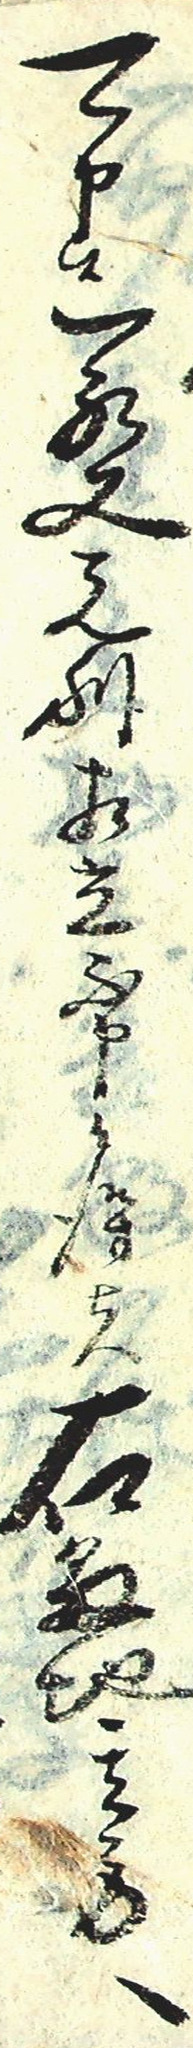可申候若又元利相立不申候得は右畠地其方へ
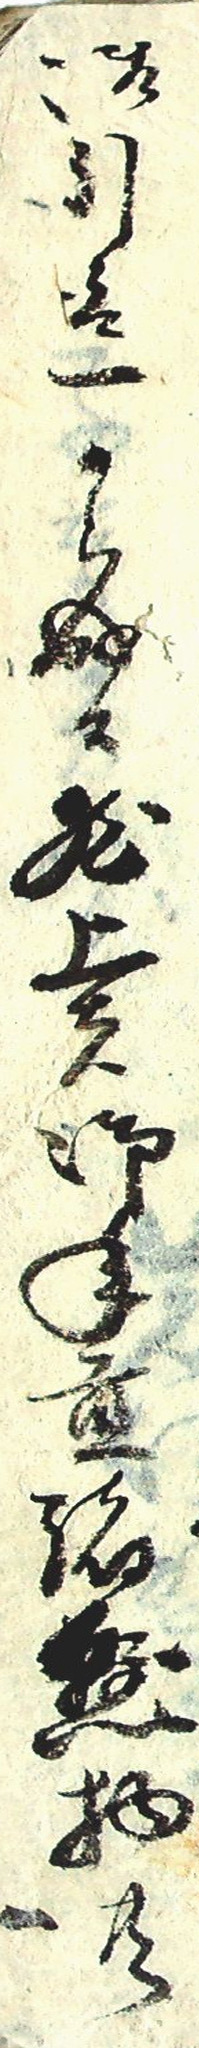御引取可被成候然上は御年貢諸懸物共

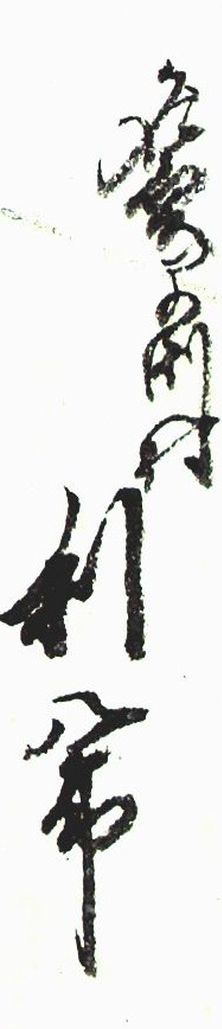利八郎
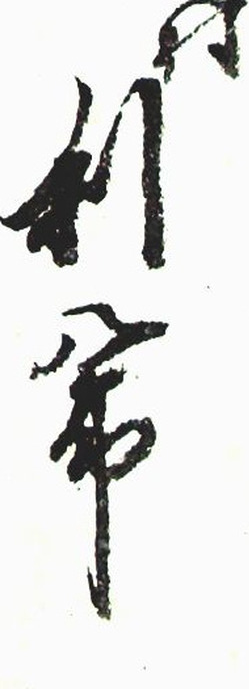利八郎
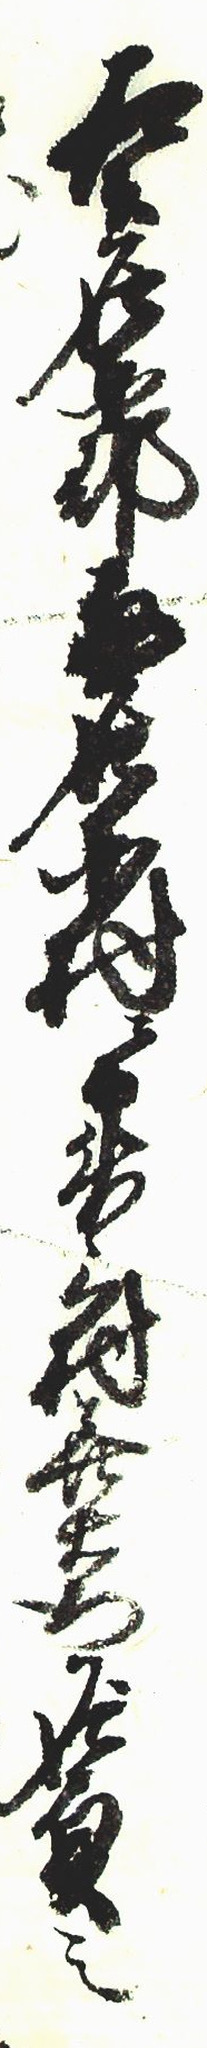右は名東郡東名東村にて矢三村喜右衛門名負之
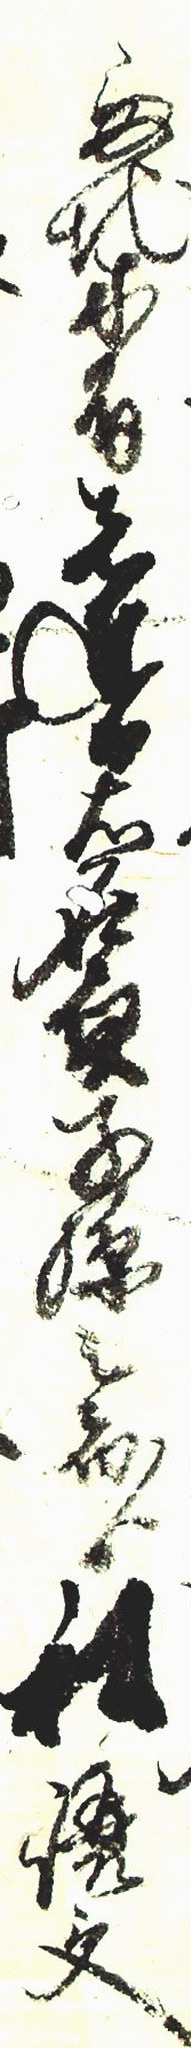畠地木間先達て右名負子孫之者ゟ私譲受
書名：諸御願書控(弐番）
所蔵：鳴門教育大学 Naruto University of Education
